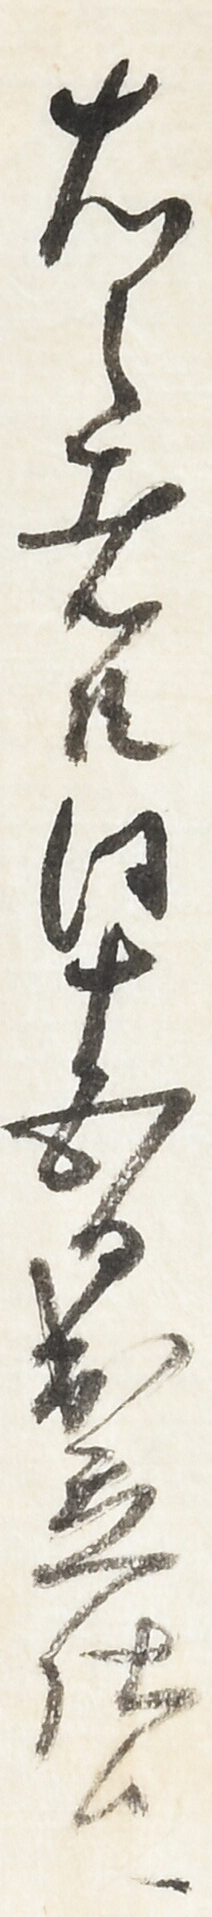右之者共同十五日出立仕候・

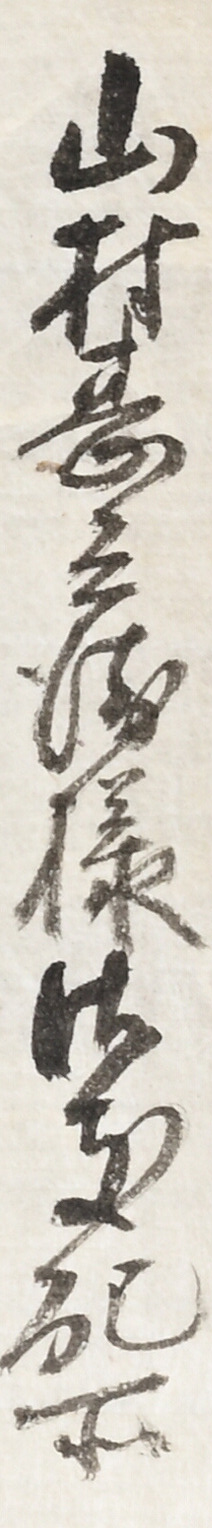山村甚兵衛様御支配所
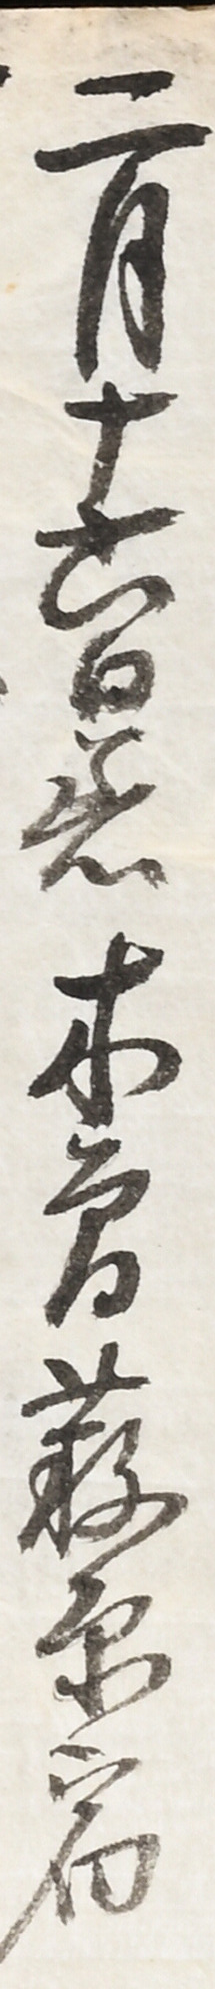二月十六日着木曽藪原宿
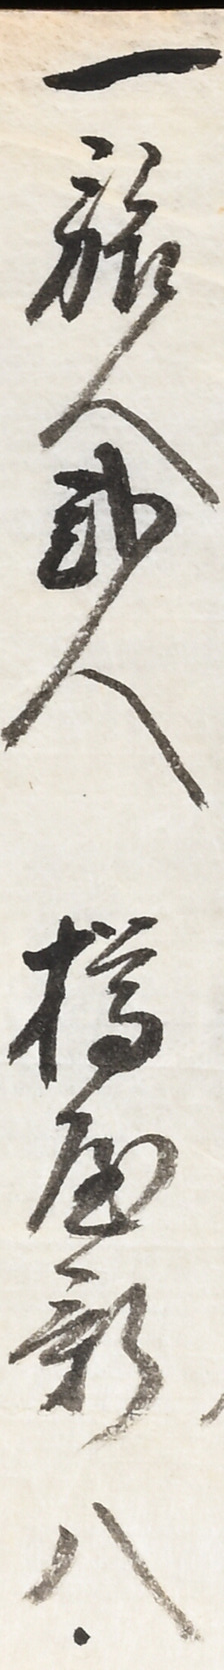一旅人弐人樽屋新八・
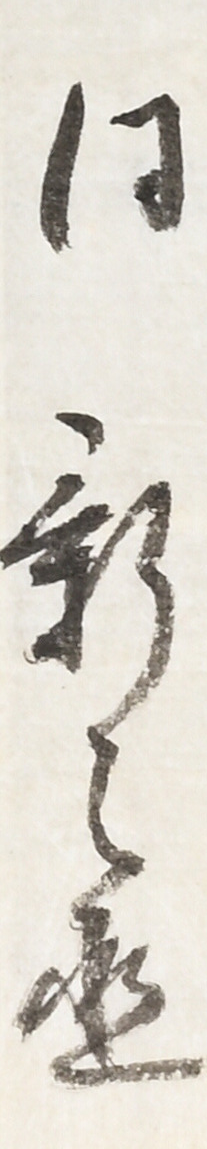同新之丞
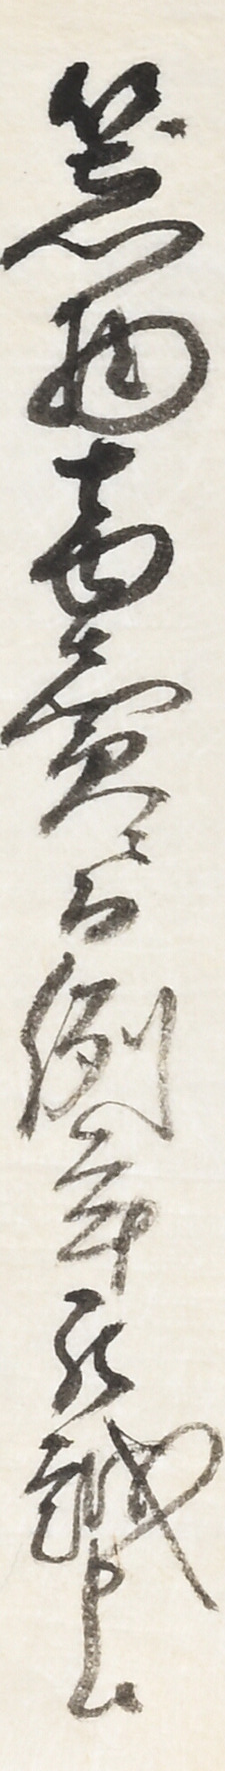器物商売ニ而例年罷越申候
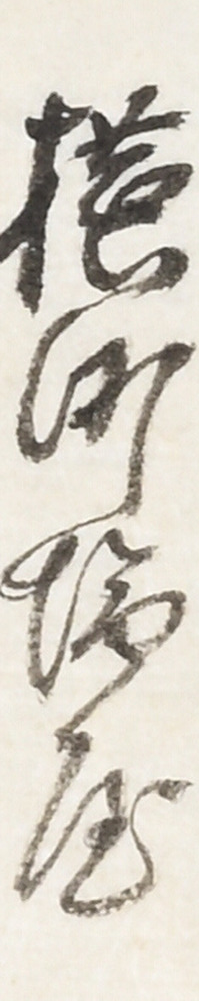横町塩屋
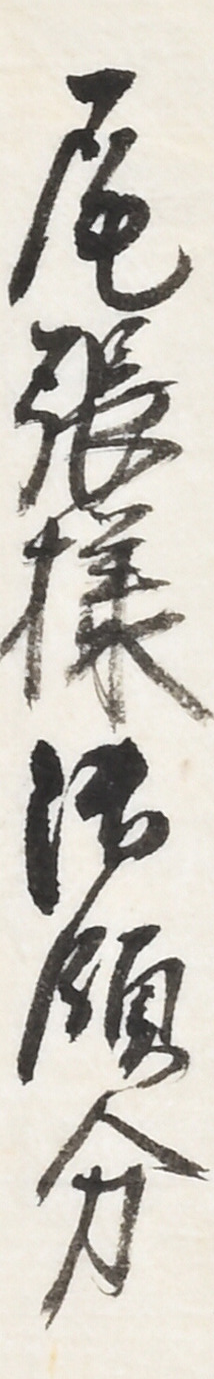尾張様御領分
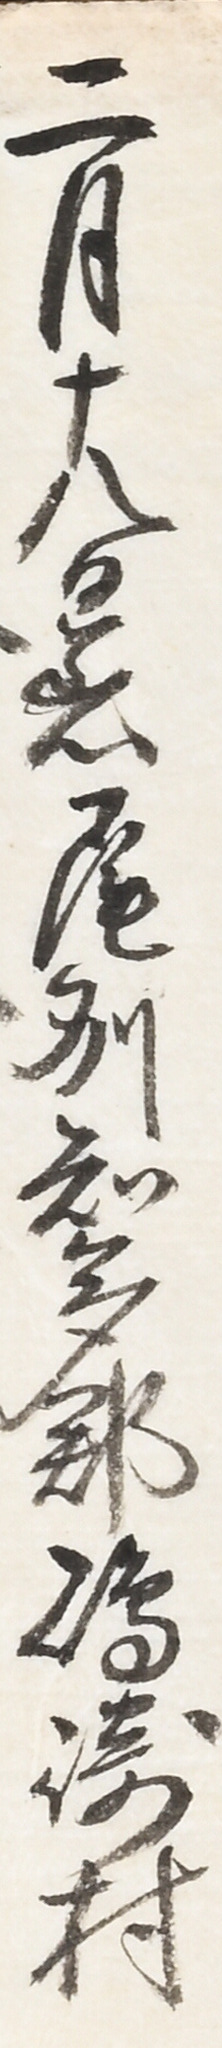二月十八日着尾州知多郡嶋崎村
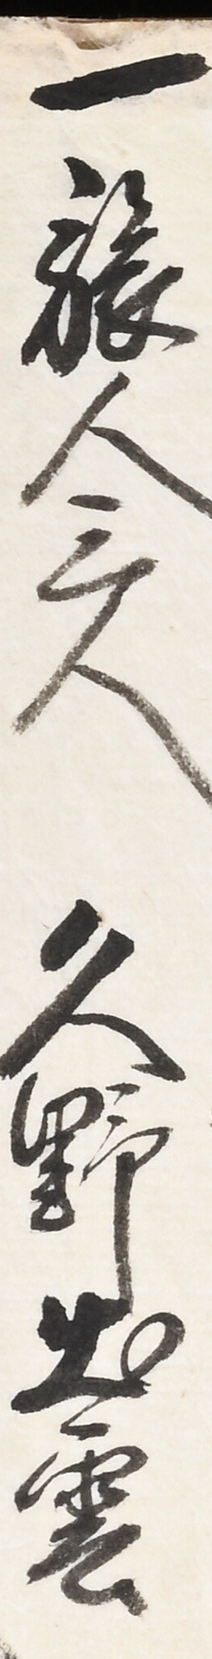一旅人三人久野出雲
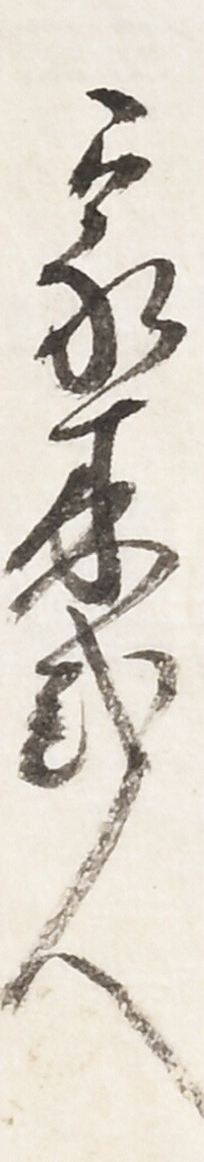家来弐人
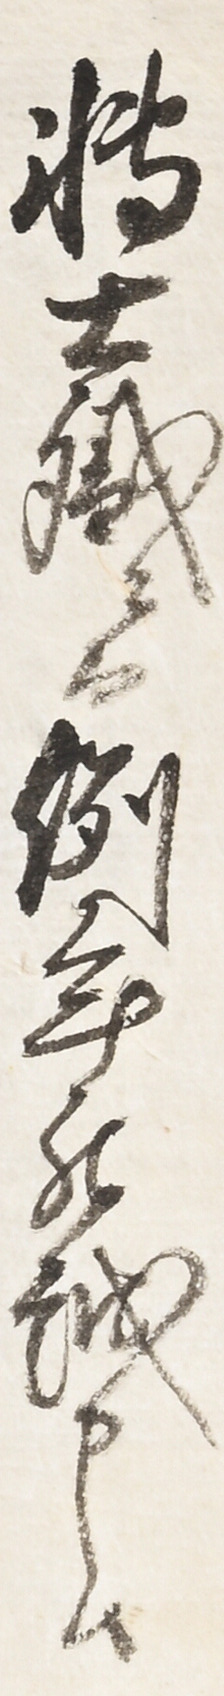転士職ニ而例年罷越申候
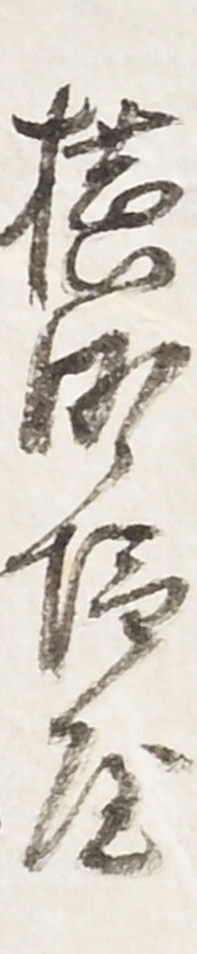横町塩屋
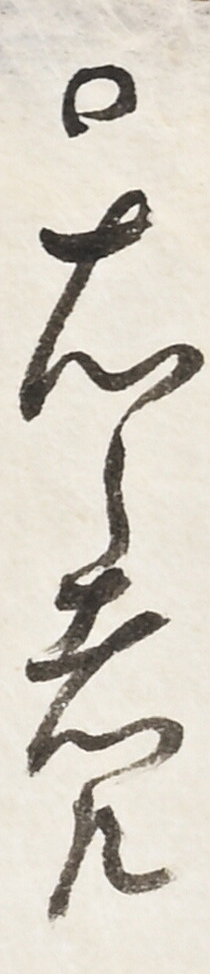〇右之者共
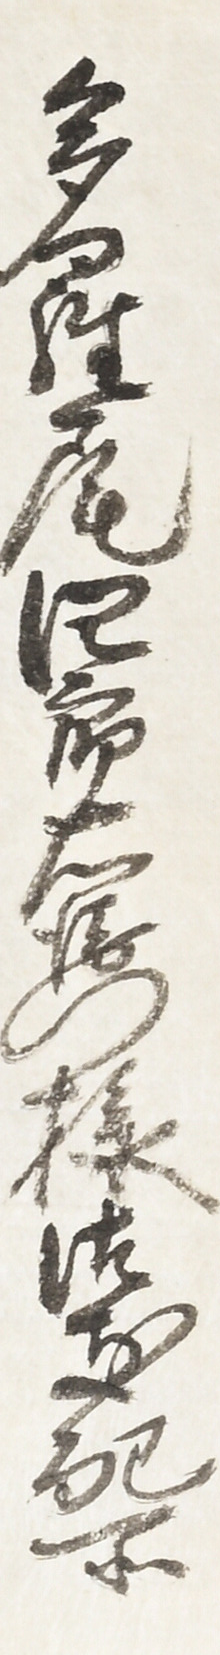多羅尾四郎右衛門様御支配所
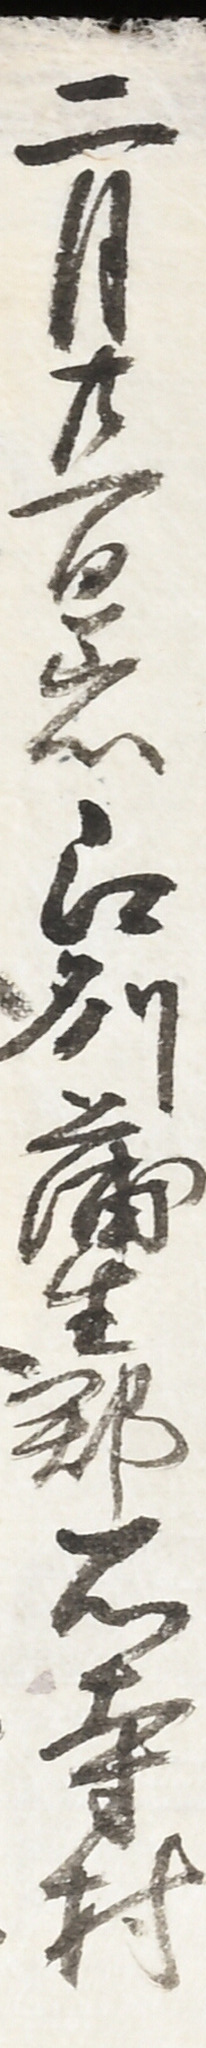弐月廿一日着江州蒲生郡石寺村
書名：旅人泊控帳
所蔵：伊那市立高遠町図書館・合同会社AMANE
